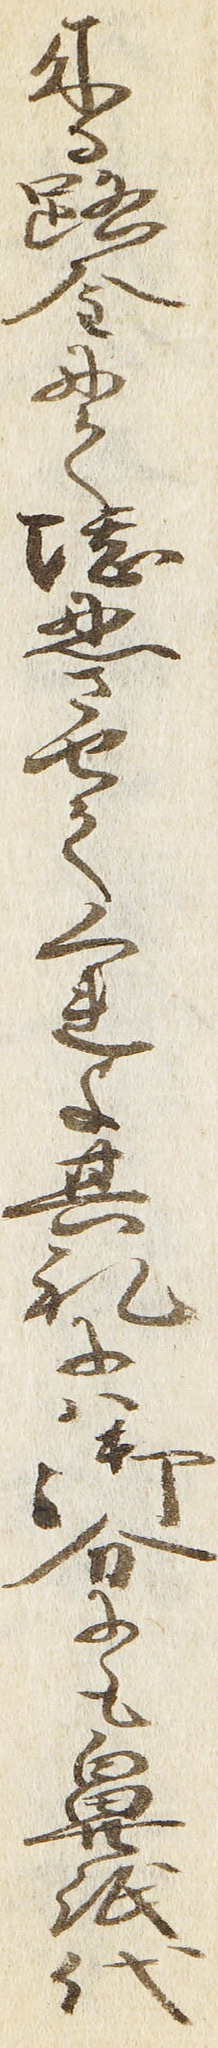来る路金にて堪忍させてくれよ其礼には御分にも鼻紙代
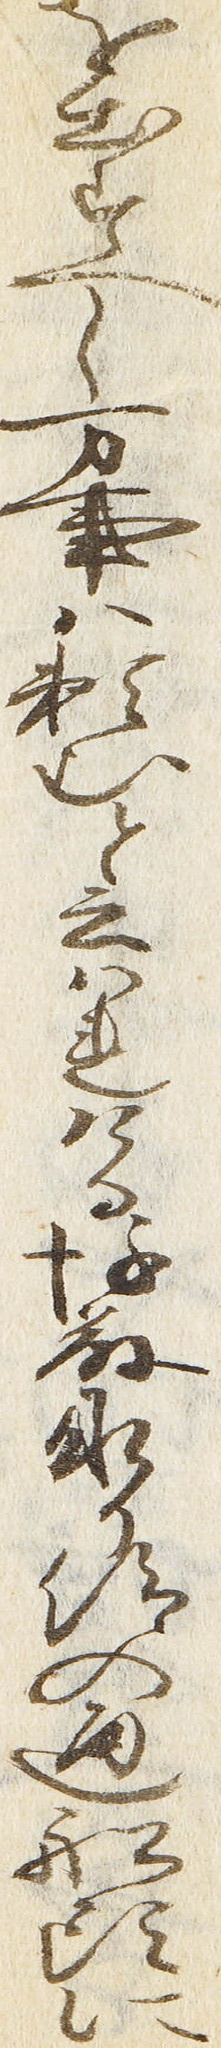を出すへし万事は頼むと云はれける後藤承り仰の通船頭に
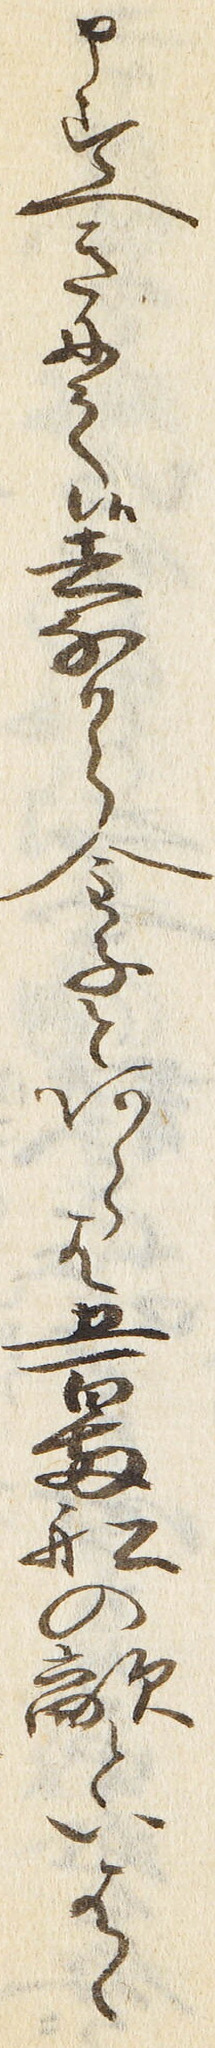申すへきにて候去なから金子とあらは五百両船の敵といはゝ
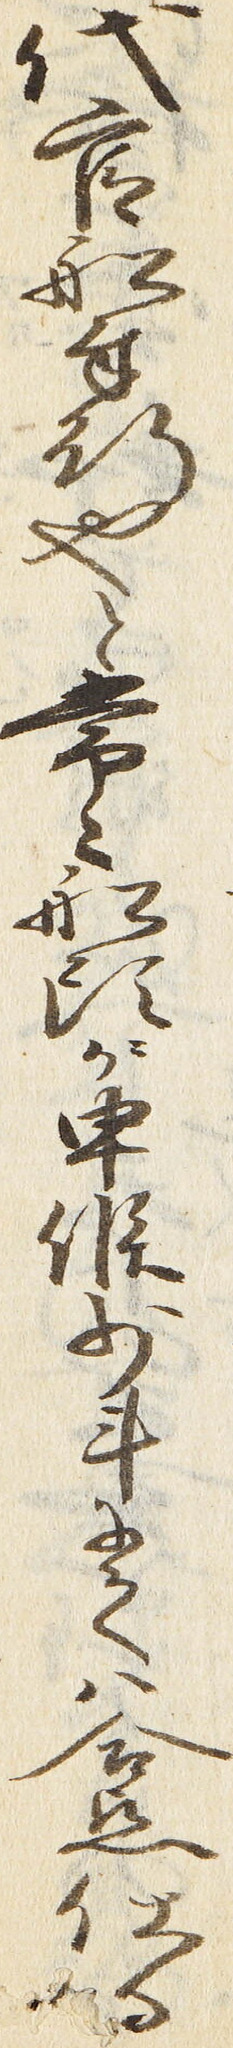代官船奉行也と常々船頭が申候少斗にては合点仕る
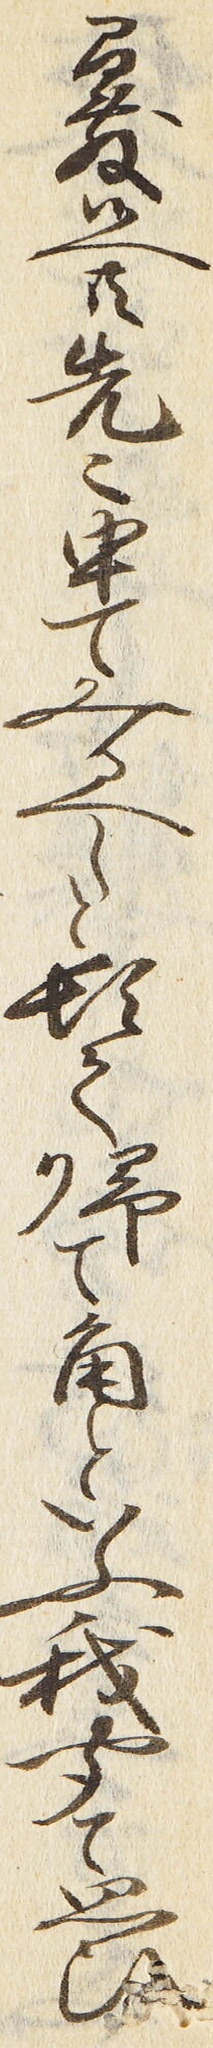間敷候へ共先々申てみるへしと頓て帰て角といふ我聞て思ひ
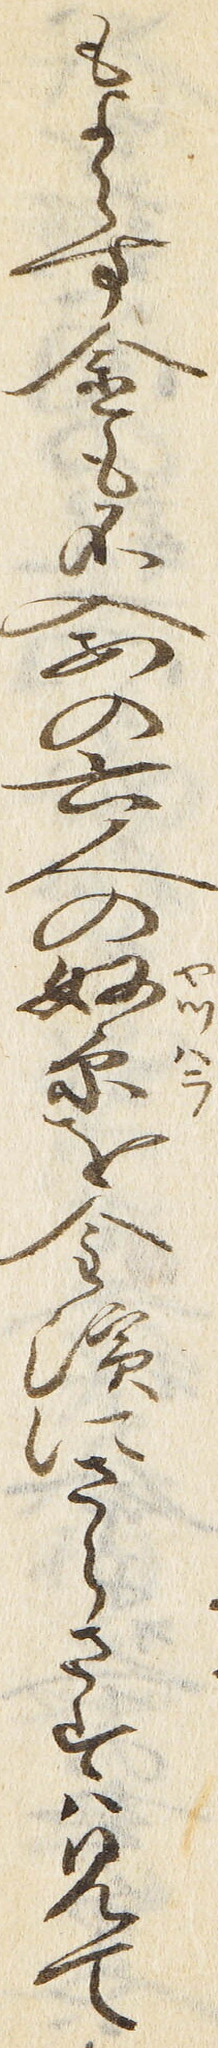もよらす金も不入あの六人の奴原を金浜にさらさすは見て
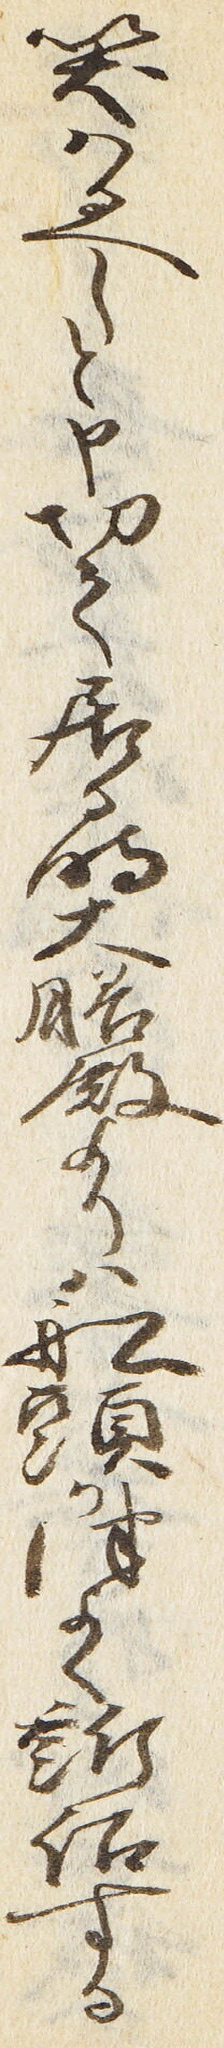笑はるへしと申切て居る時大膳殿よりは船頭かつよく訴訟する
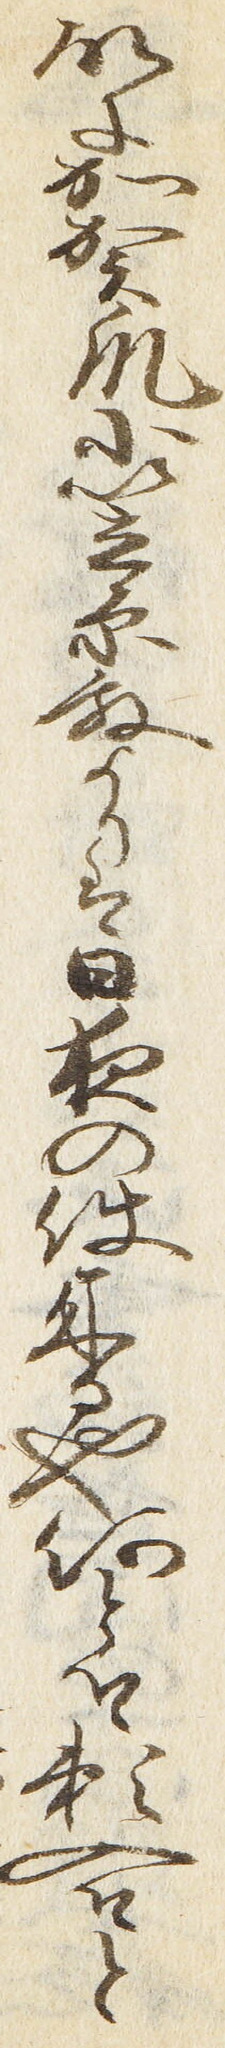故に加賀爪小笠原殿よりは日夜の使来る也何とそ頼入そと
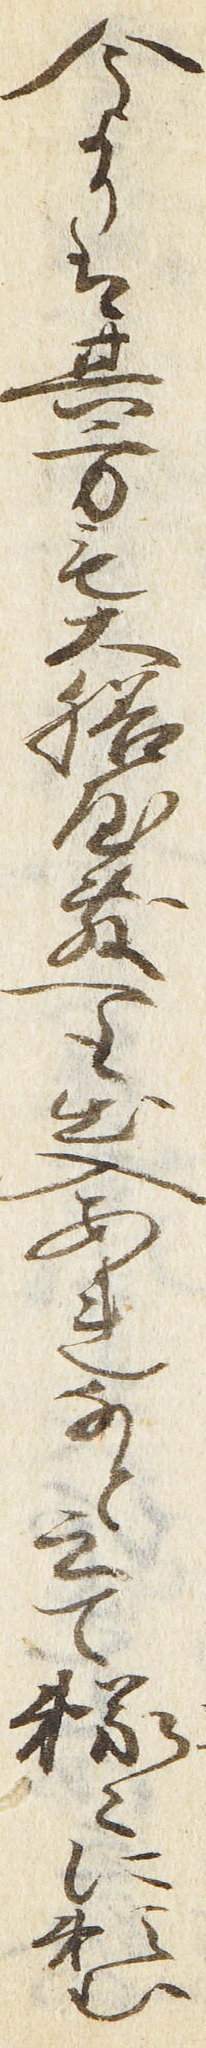今よりは其方も大膳屋敷へも出入あれなと云て様々に頼む
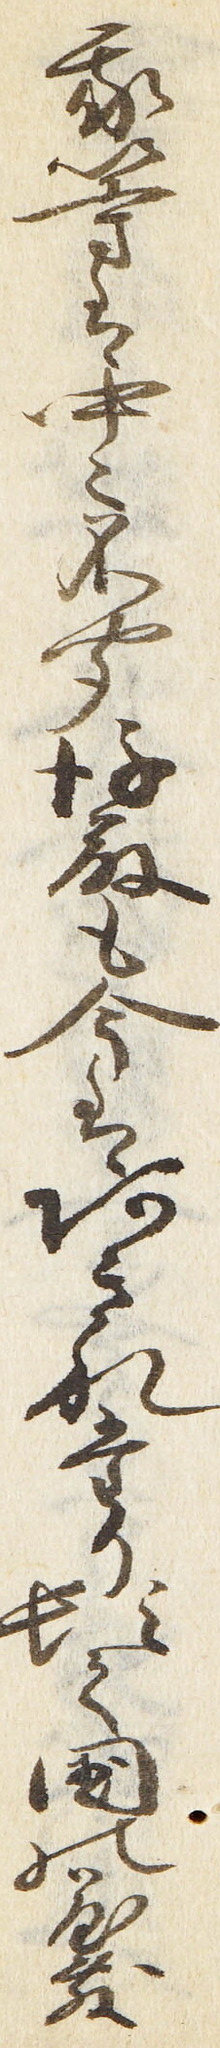我等は中々不聞後藤も今はあきれたり頓て国の屋敷
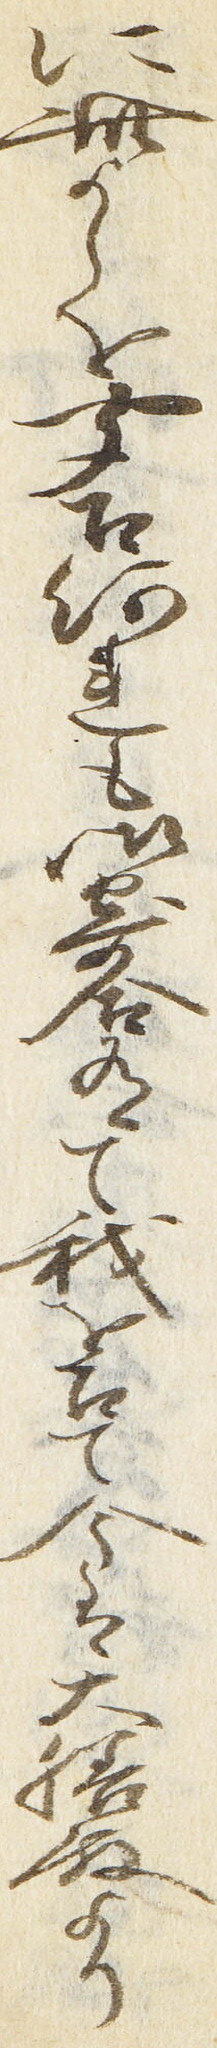に此よしを聞召何れも御寄合有て我を召て今は大膳殿より
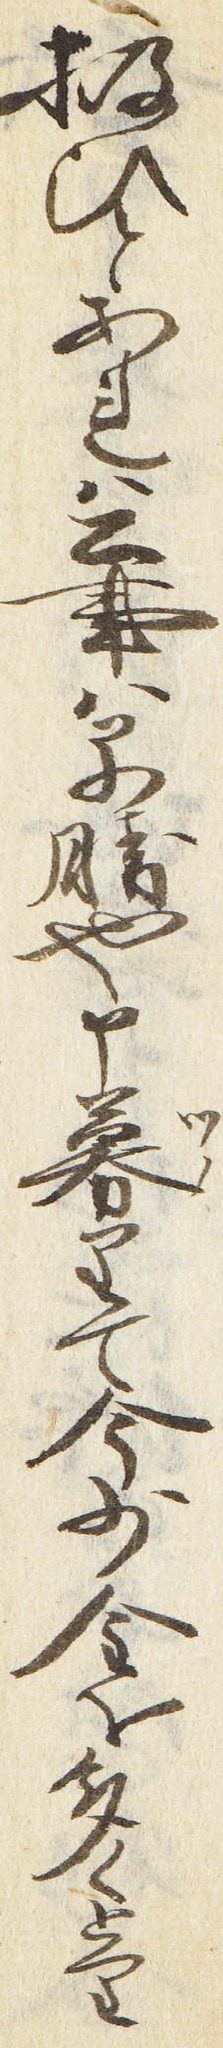扱ひとあれは公事は早勝也申募りて今少金を多くとり
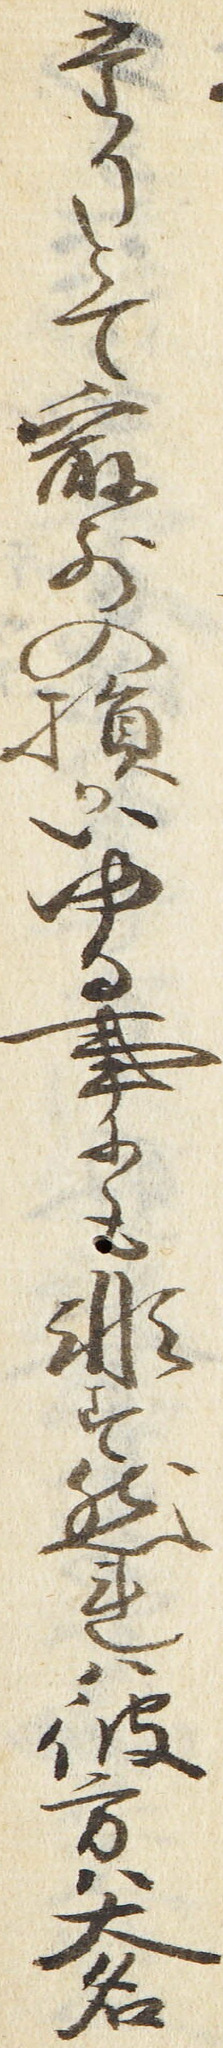たりとて最前の損かいゆる事にも非す然れは彼方は大名

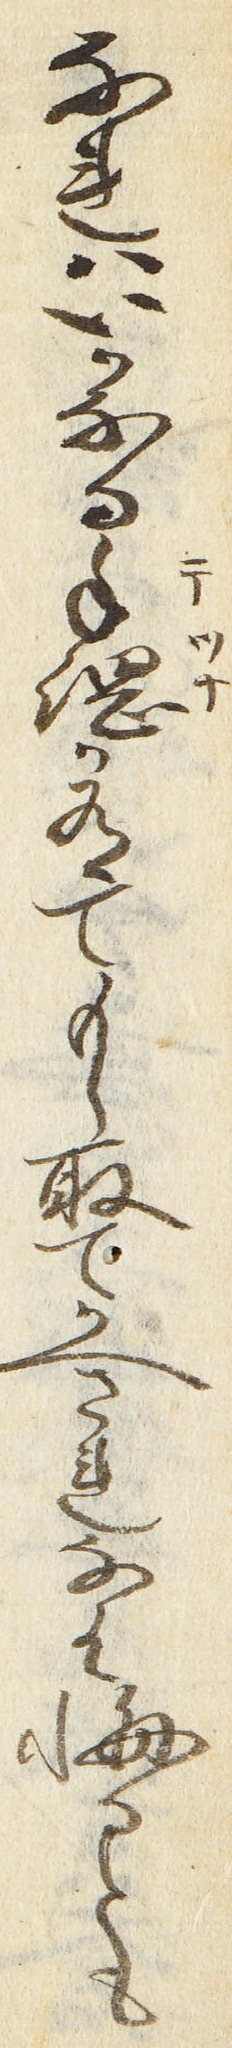なれはいかなる手綱か有てもし取てかへされなは悔るとも
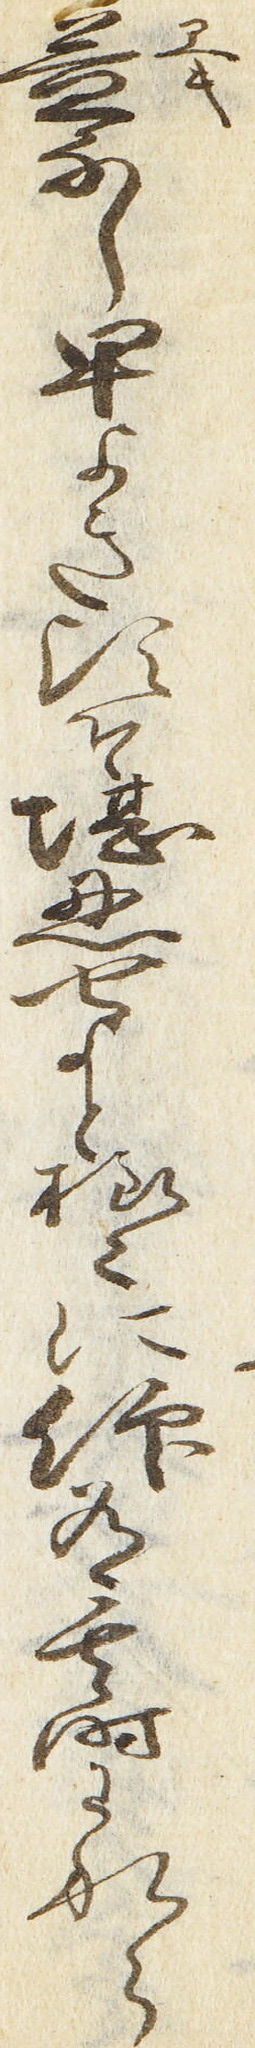益なし早よき頃そ堪忍せよと様々に仰有其時になり
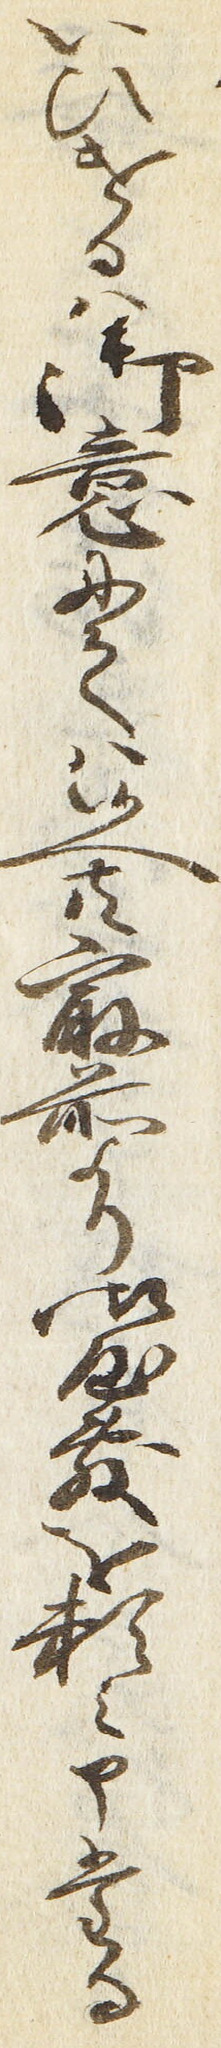いひけるは御意にては候へ共最前より御屋敷を頼み申たる
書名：海陸世話日記
